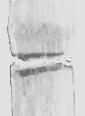二
